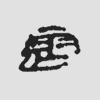{雨亡}
